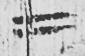二
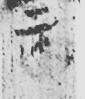百
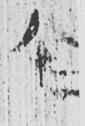八十=
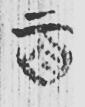百
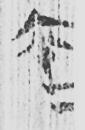六十=
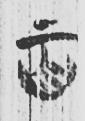百
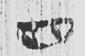四
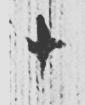十
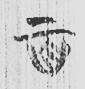百
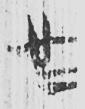廿=
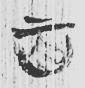百
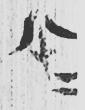八十=
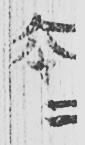六十=
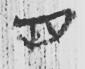四
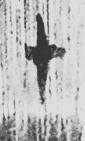十
